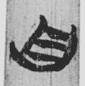自
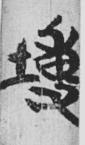○（敷）
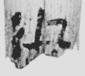○（卜）
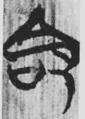命（令）
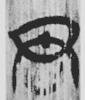尹
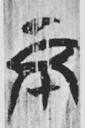不
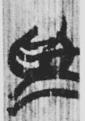爲
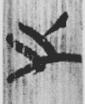之
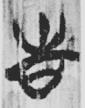告
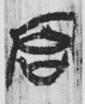君
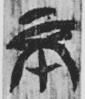不
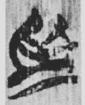爲
